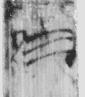隹
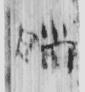{阜川一川}
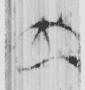立
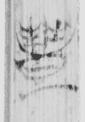豐
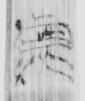彔
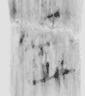𫊟
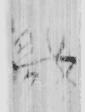幾
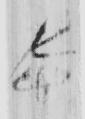{旡心}
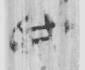女
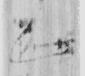亡
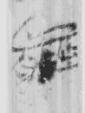能
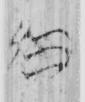於
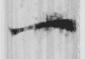一
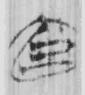官
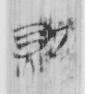則
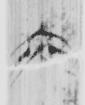亦
